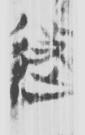﨤
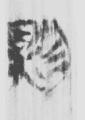則
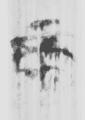不
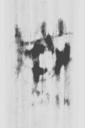成
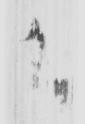人
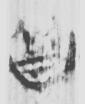皆
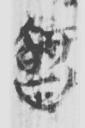智
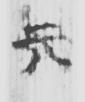亓
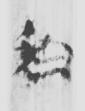於
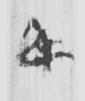身
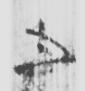之
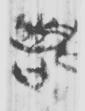若
